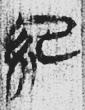紀
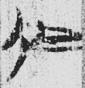於
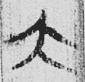大大
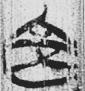國國
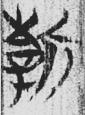新
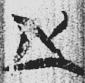之
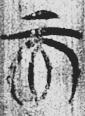天
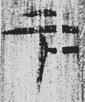下
